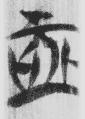亟
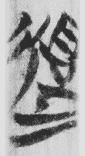道
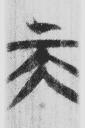天
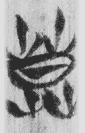莫
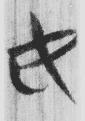女
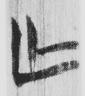亡
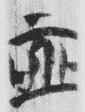亟
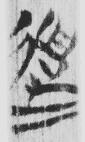道
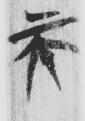天
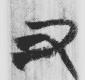又
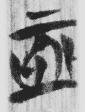亟
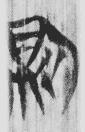則
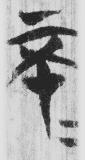不=
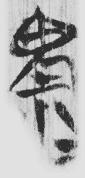{鬼示}=
